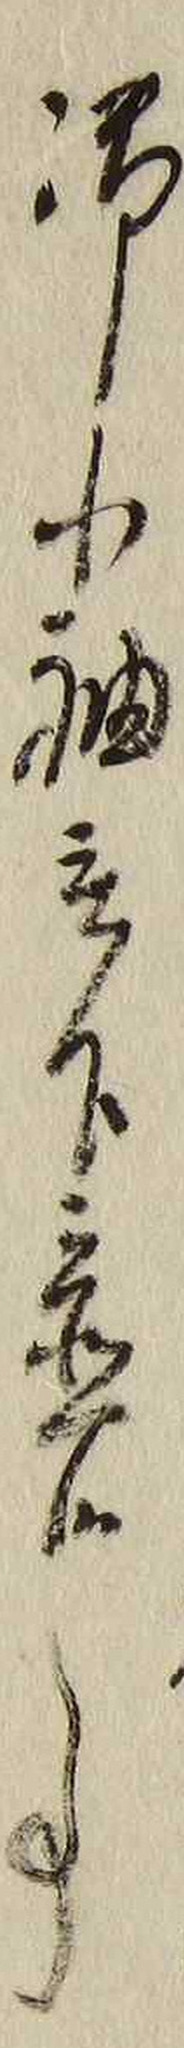御小袖被下置候事
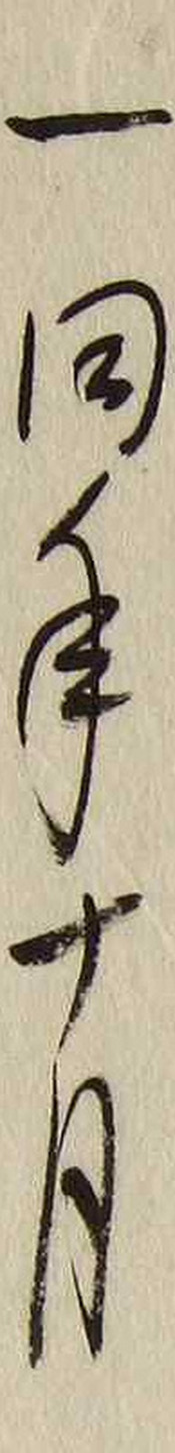一同年十月
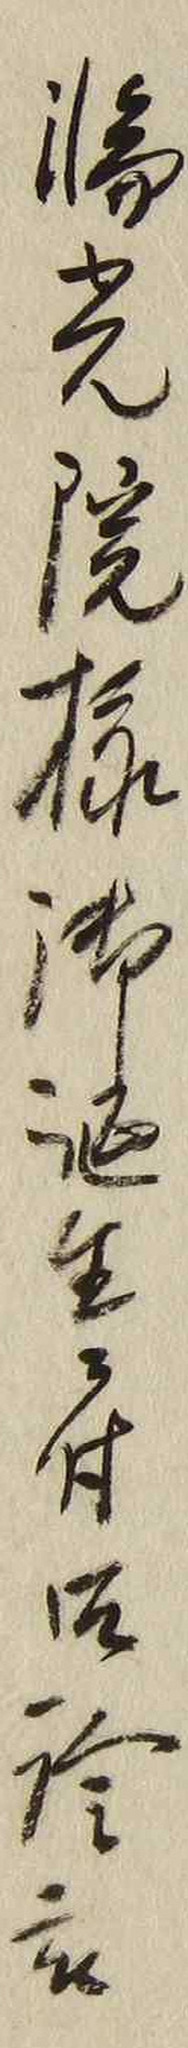輪光院様御誕生ニ付御診被

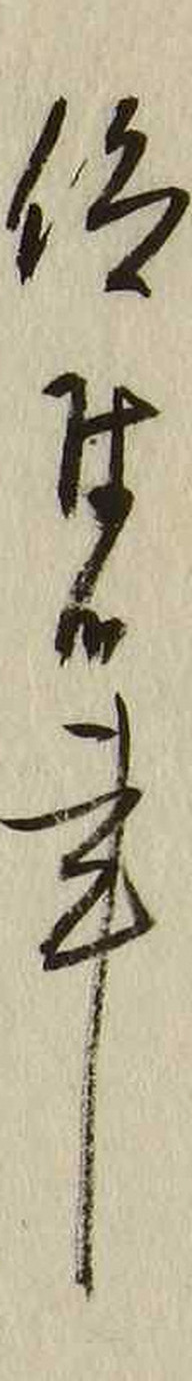仰付候事
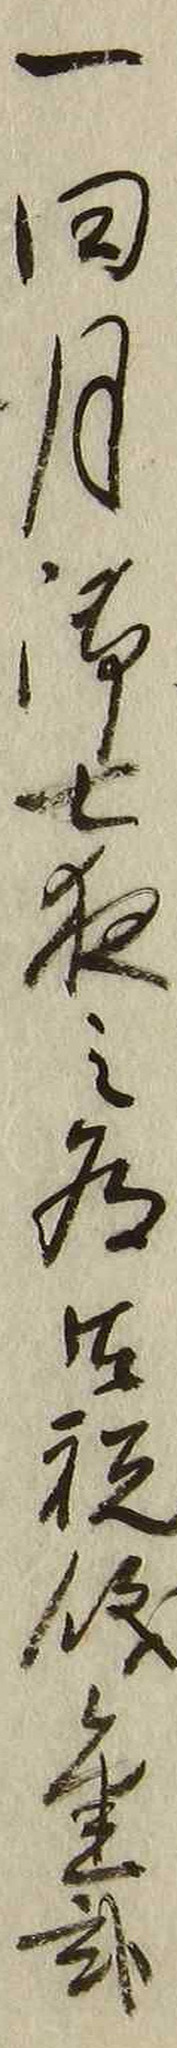一同月御七夜之為御祝儀金弐
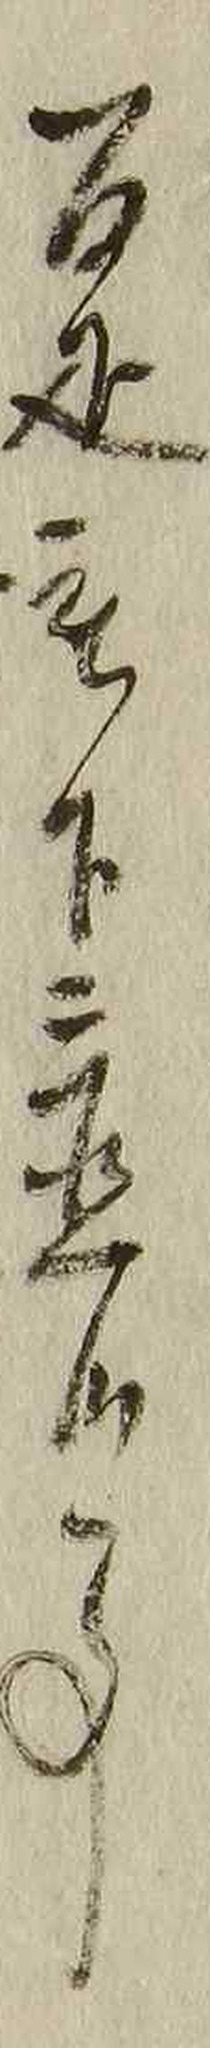百疋被下置候事
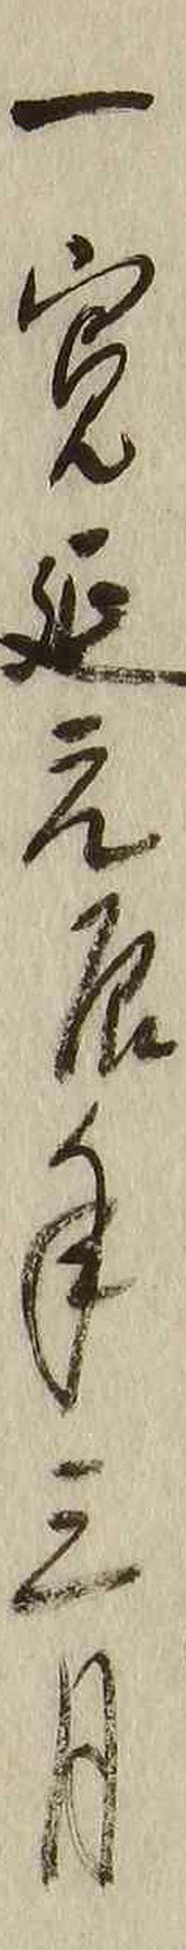一寛延元辰年三月
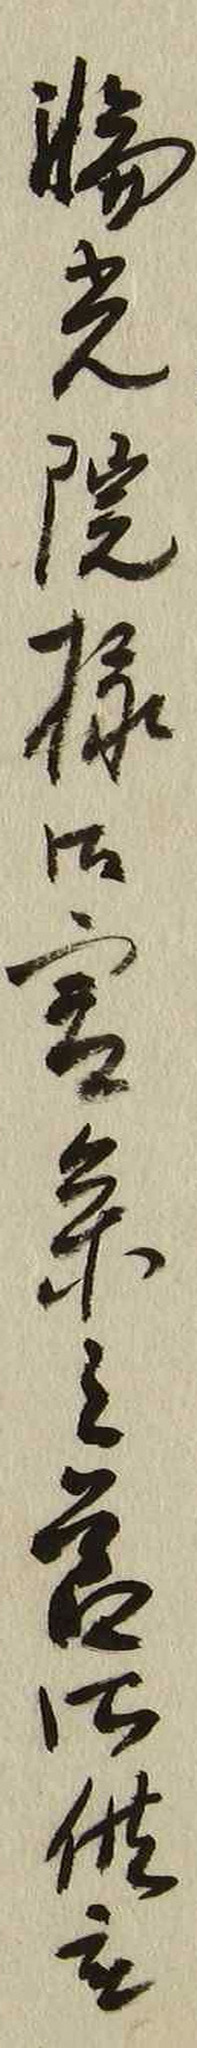輪光院様御宮参之節御供被
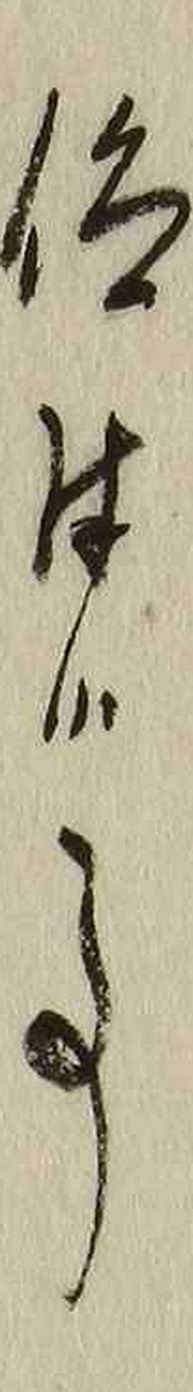仰付候事
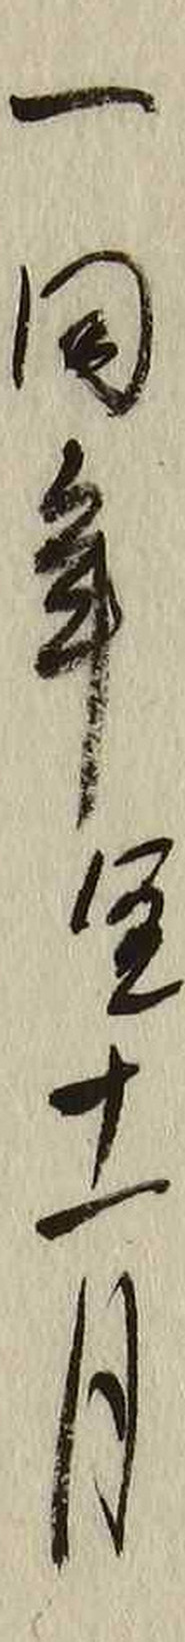一同年閏十一月
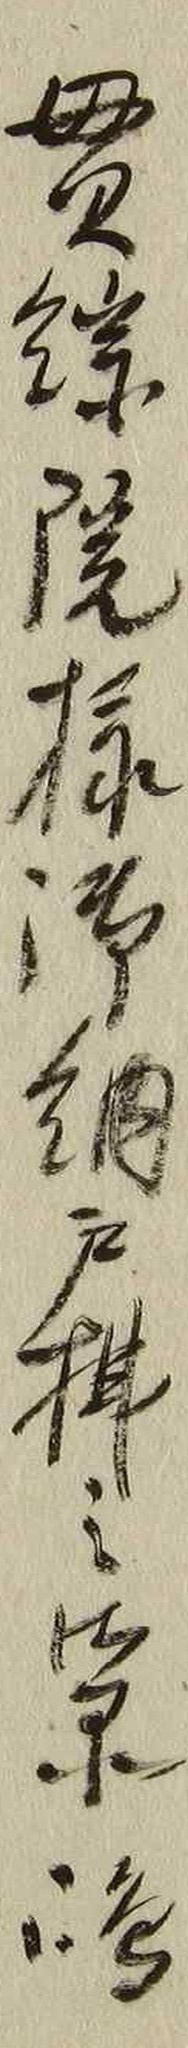貫綜院様御納戸払之御品島
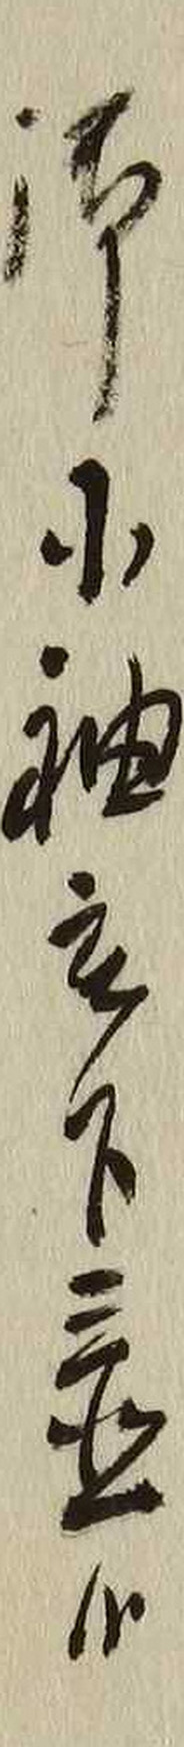御小袖被下置候
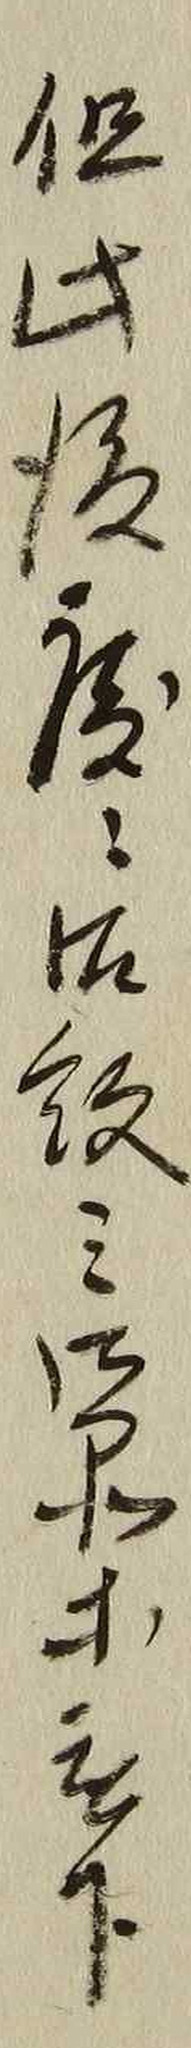但此後度々御紋之御品等被下
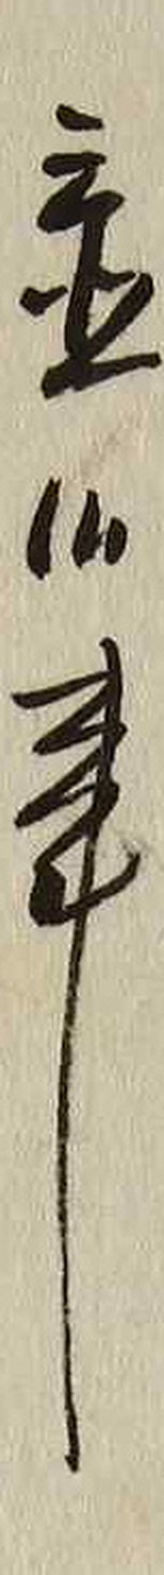置候事
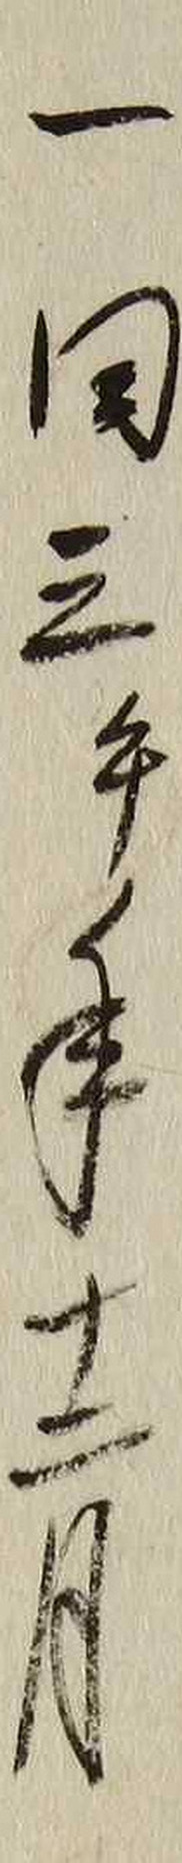一同三午年十二月
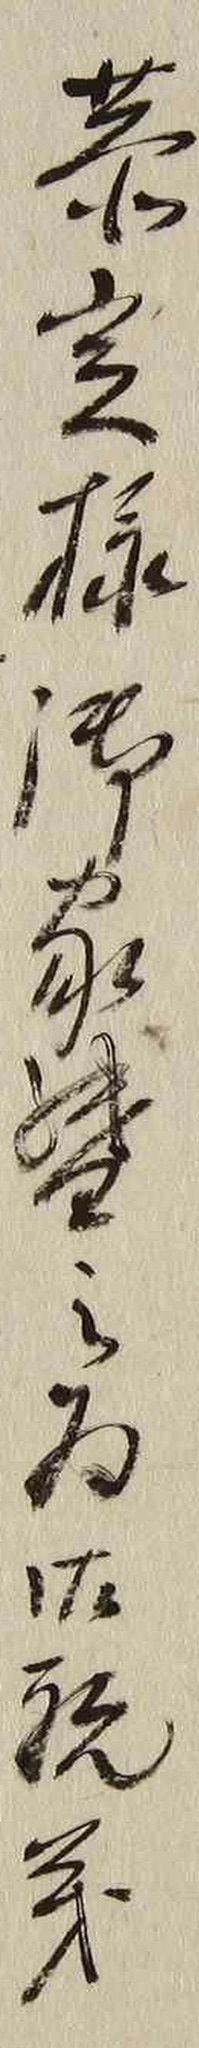恭定様御家督之為御祝義
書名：諸士系譜　巻之353　す之部3
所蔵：会津若松市立会津図書館
